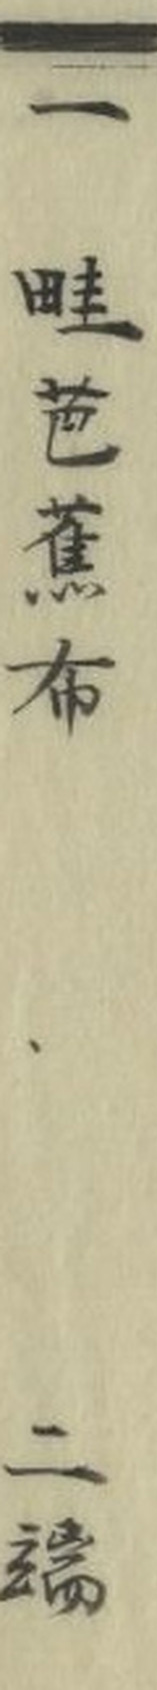一畔芭蕉布二端
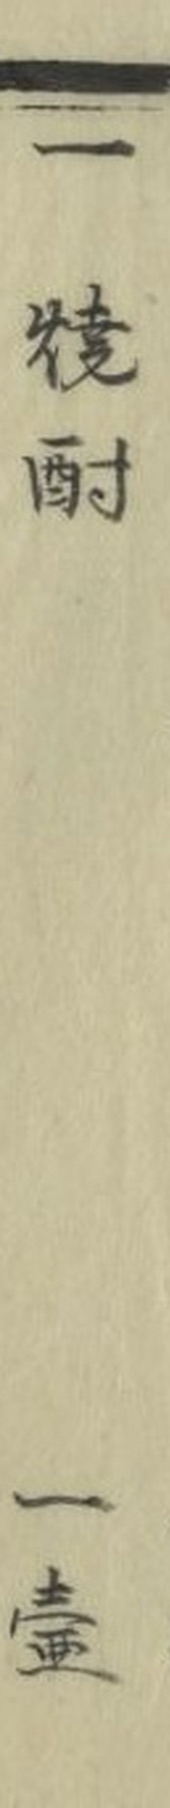一焼酎一壺
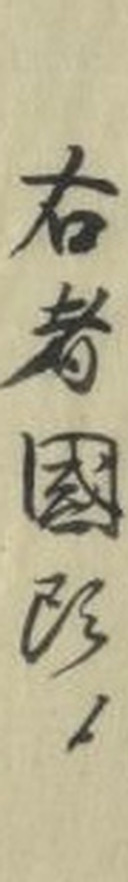右は国頭ゟ
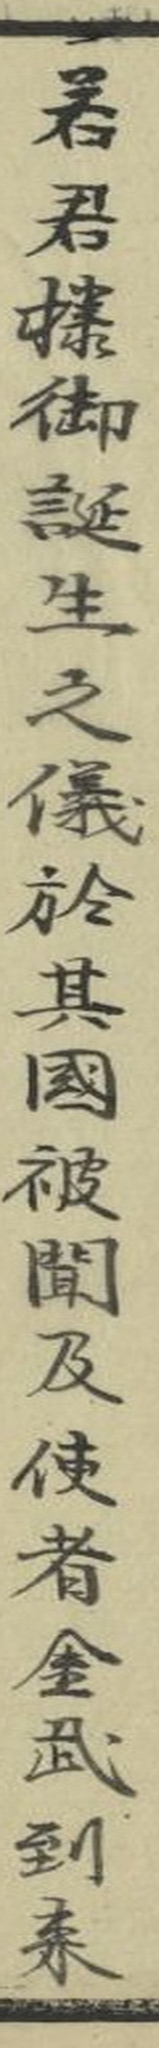若君様御誕生之儀於其国披聞及使者金武到来
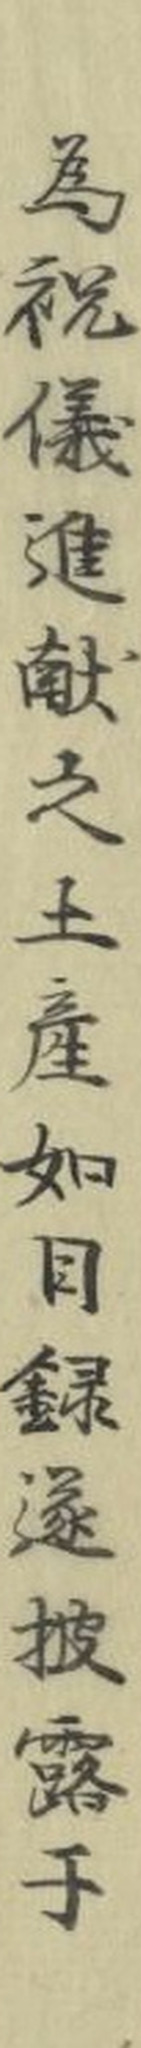為祝儀進献之土産如目録遂披露子
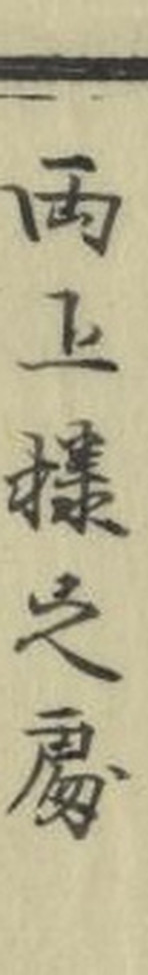両上様之處
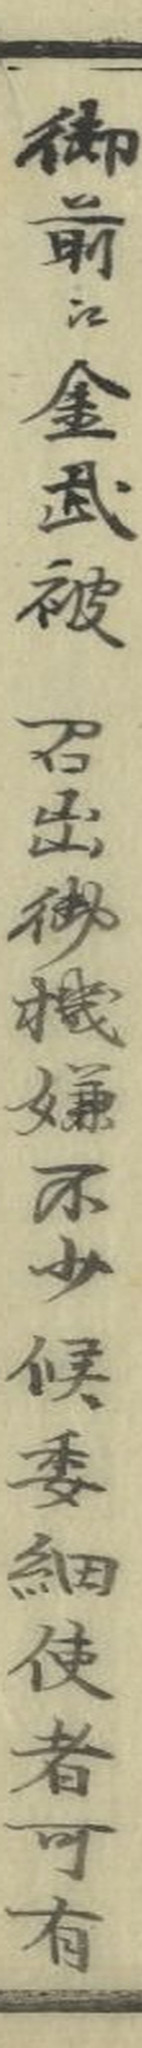御前え金武披召出御機嫌不少候委細使者可有
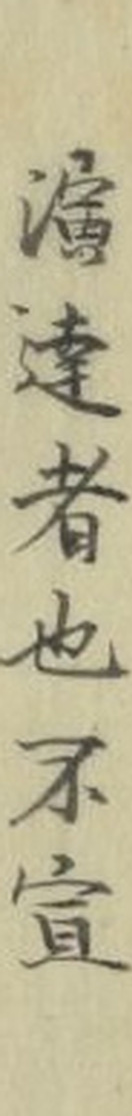演達者也不宣
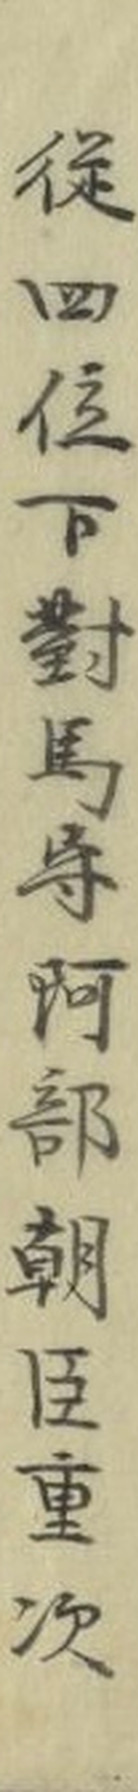従四位下對馬守阿部朝臣重次
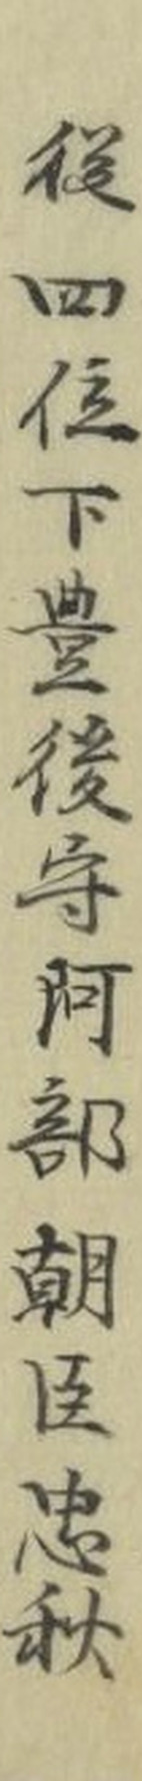従四位下豊後守阿部朝臣忠秋
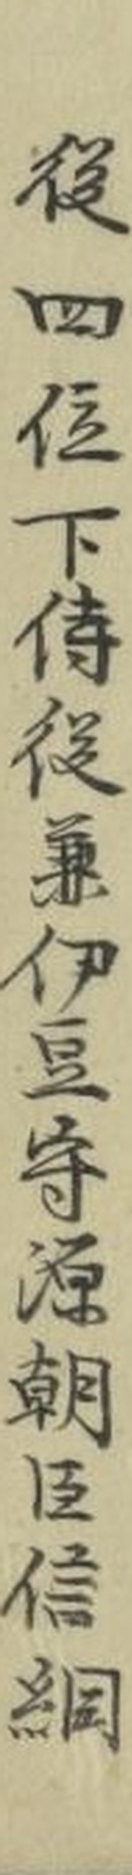従四位下侍従兼伊豆守源朝臣信綱

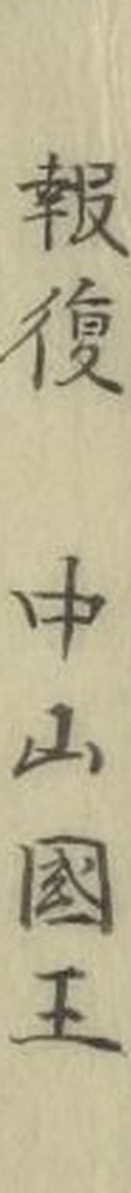報復中山国王
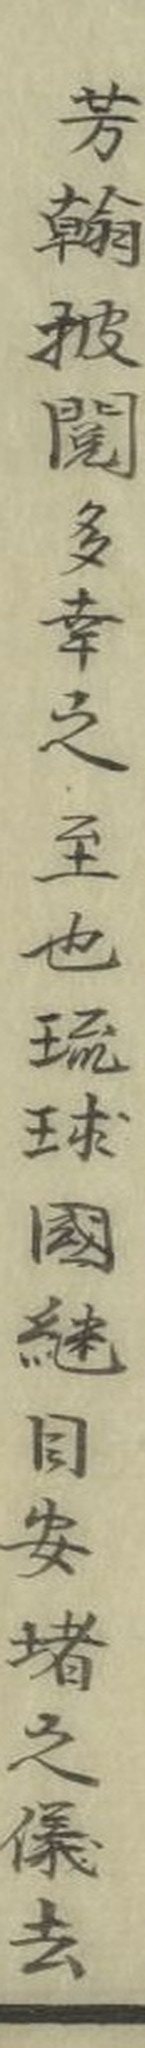芳翰披閲多幸之至也琉球国継目安堵之儀去
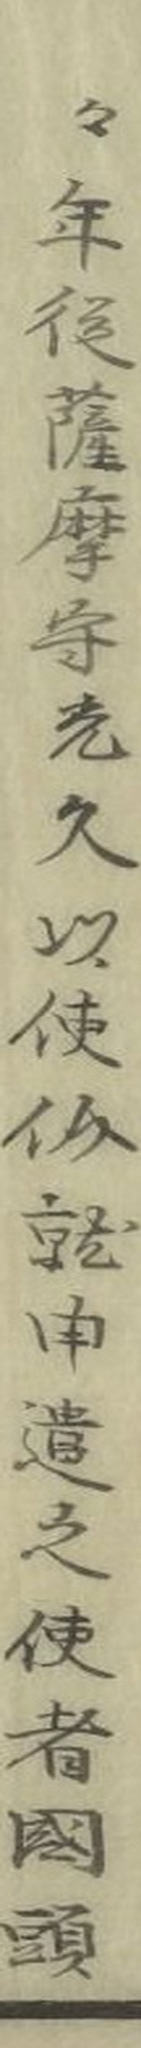々年従薩摩守充久以使价就申遣之使者国頭
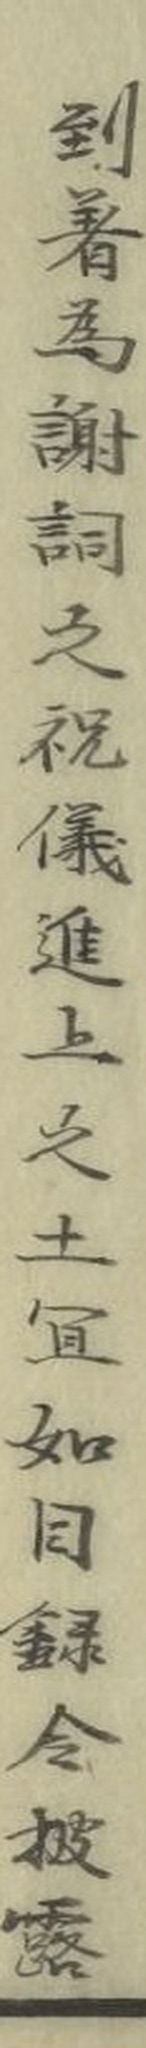到着為謝詞之祝儀進上之土冝如目録令披露
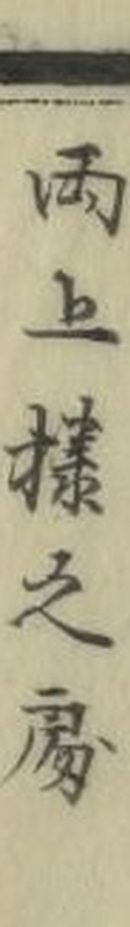両上様之處
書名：琉球往来（上）
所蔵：University of the Ryukyus Library
